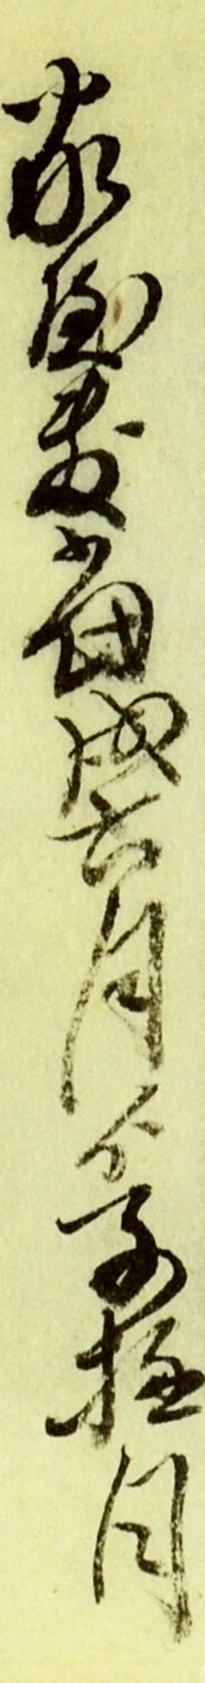家屋敷当戌六月ゟ子極月
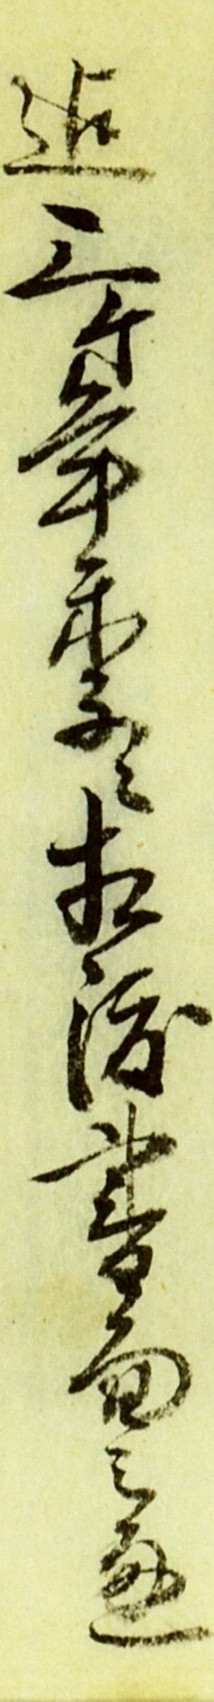迄三ヶ月年季ニ相渡書面之通
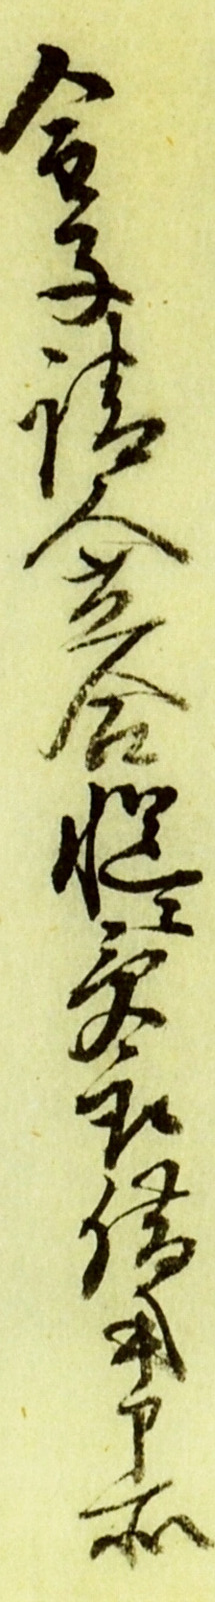金子請人立合慥ニ受取借用申所
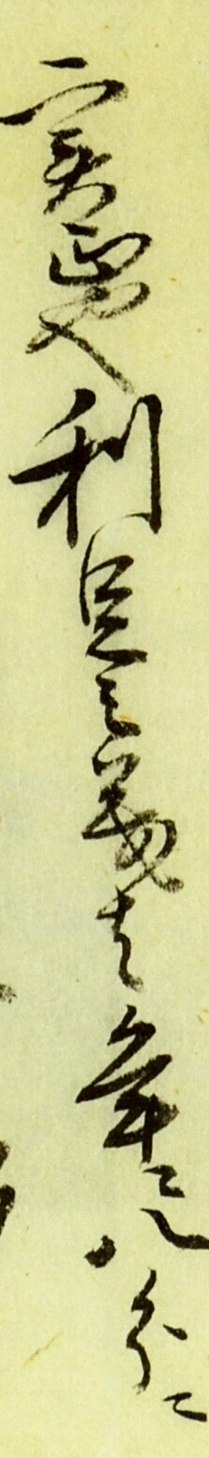実正也利足之義者年ニ八分ニ
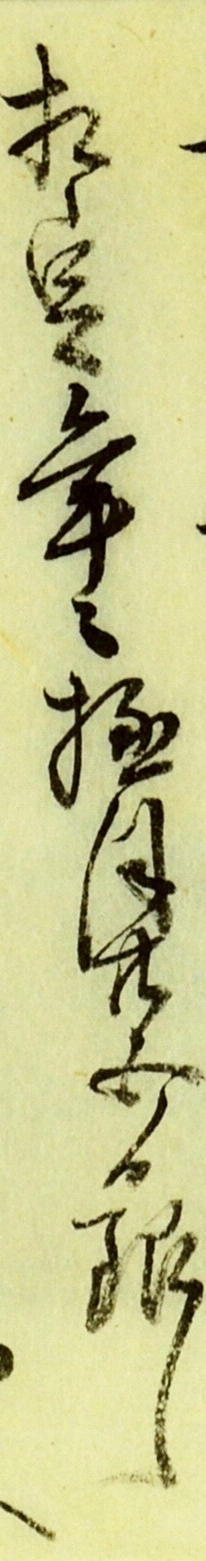相定年々極月廿五日限り
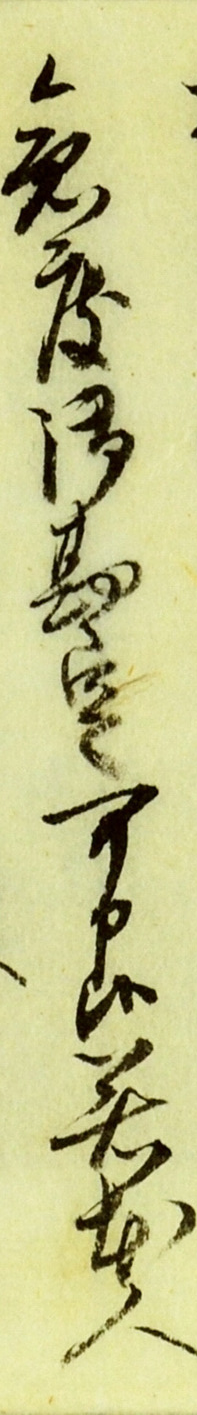急度御勘定可申候若本人
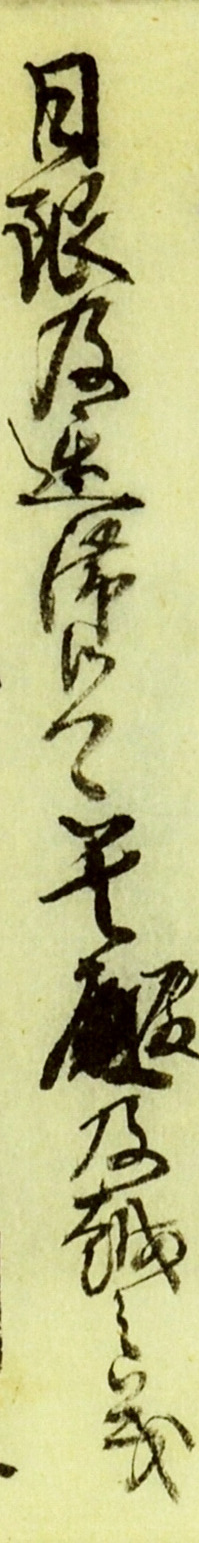日限及遅滞候ハヽ貴殿及越之義
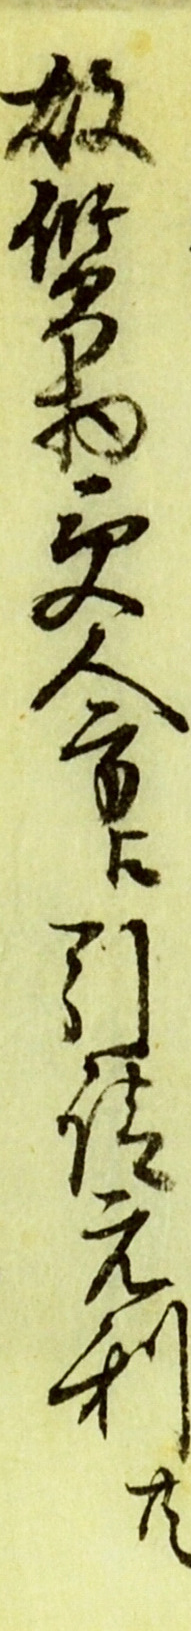故質物受人方江引請元利共
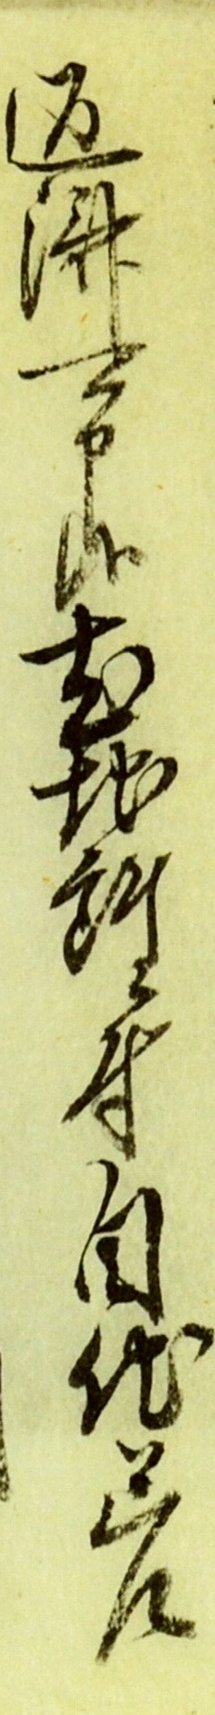返済可申候尤地所ニ付自地差
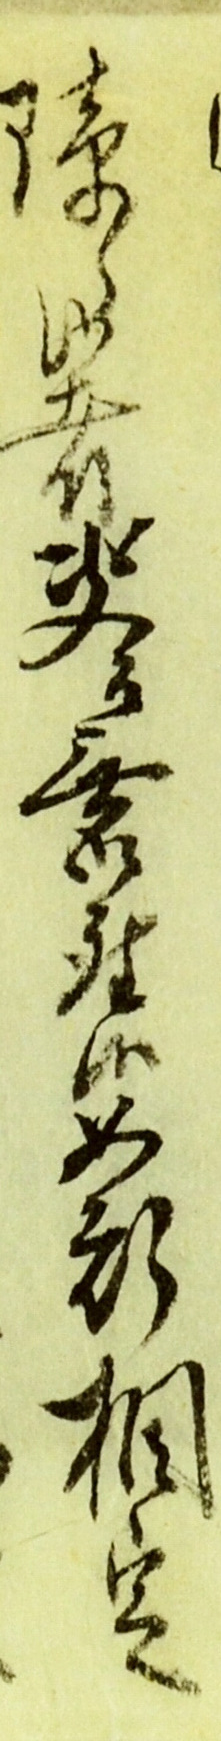障り候者決而無御座候如斯相定
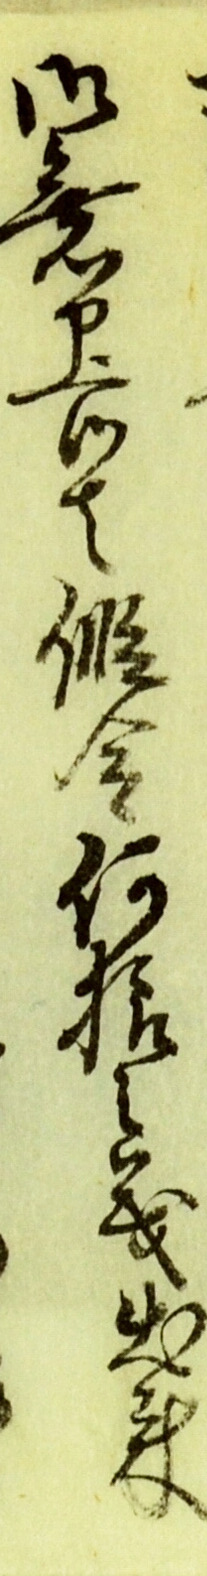御無心申上候者縦令何様之義出来
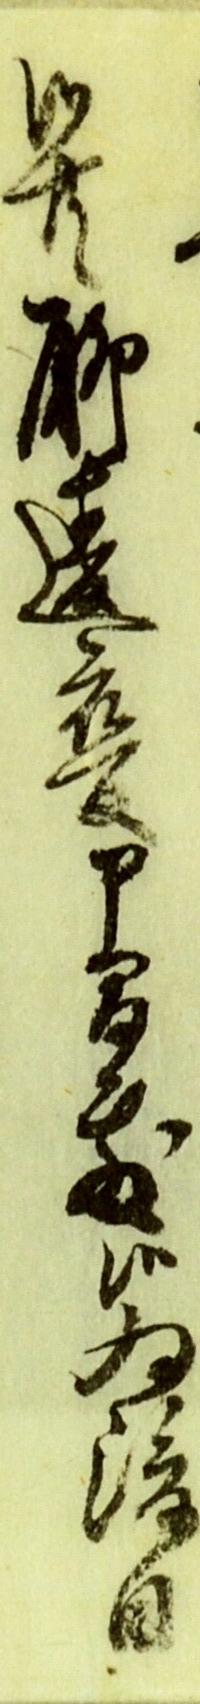候共聊違変申間敷候為後日
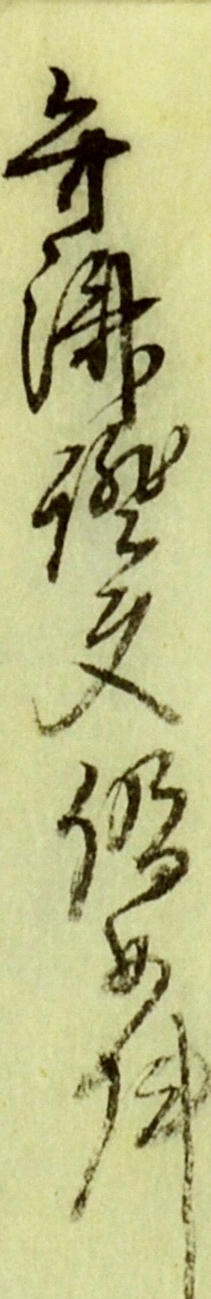弁済証文仍而如件
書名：造酒株一件始末
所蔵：伊那市立高遠町図書館・合同会社AMANE
